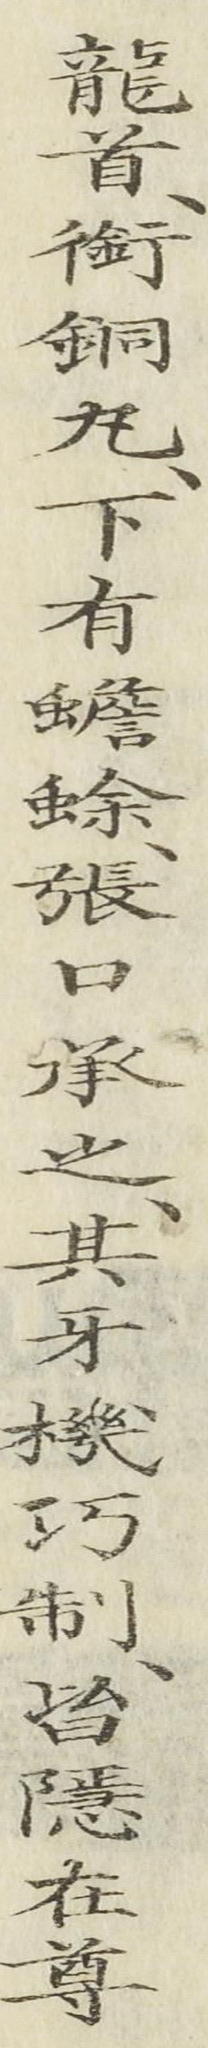龍首、銜銅丸、下有蟾蜍、張口承之、其牙機巧制、皆隠在尊
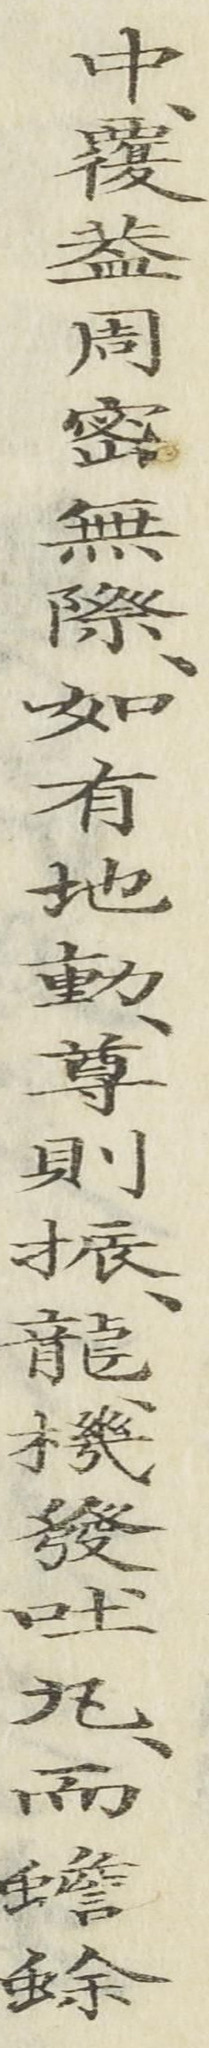中、覆蓋周密無際、如有地動、尊則振、龍機発吐丸、而蟾蜍
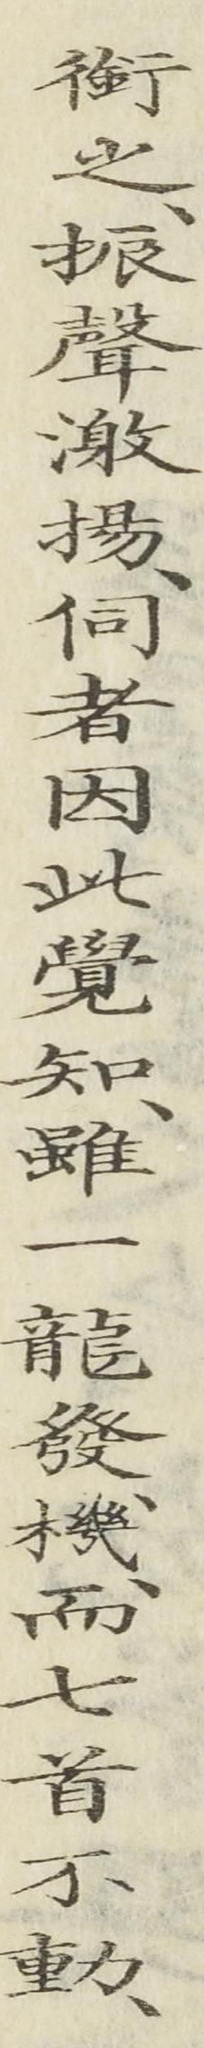銜之、振声激揚、伺者因此覚知、雖一龍発機、而七首不動、
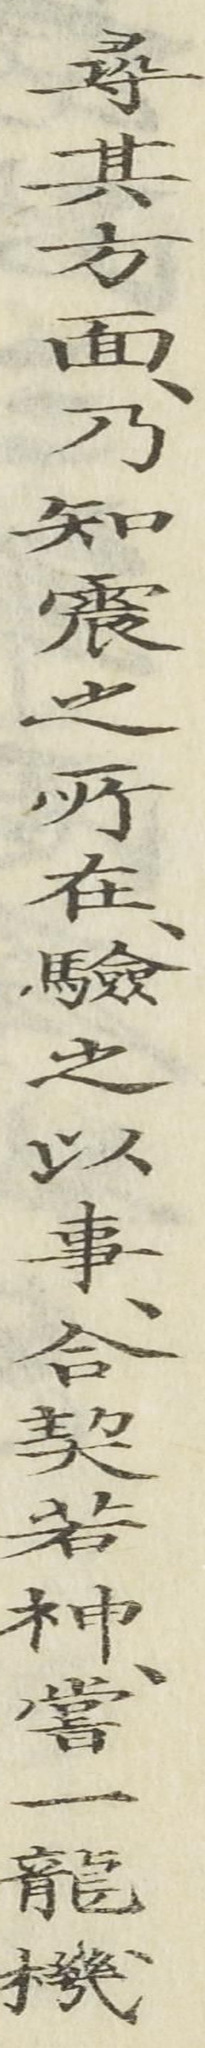尋其方面、乃知震之所在、験之以事、合契若神、嘗一龍機
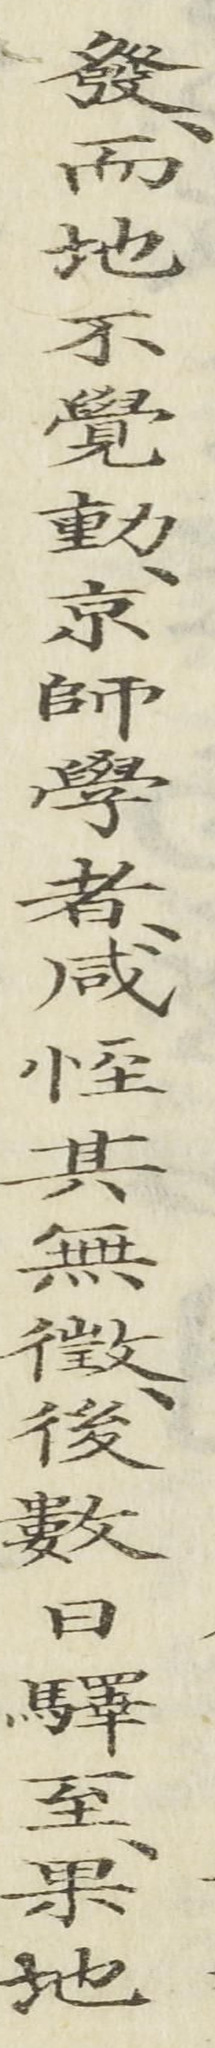発、而地不覚動、京師学者、咸怪其無徴、後数日駅至、果地
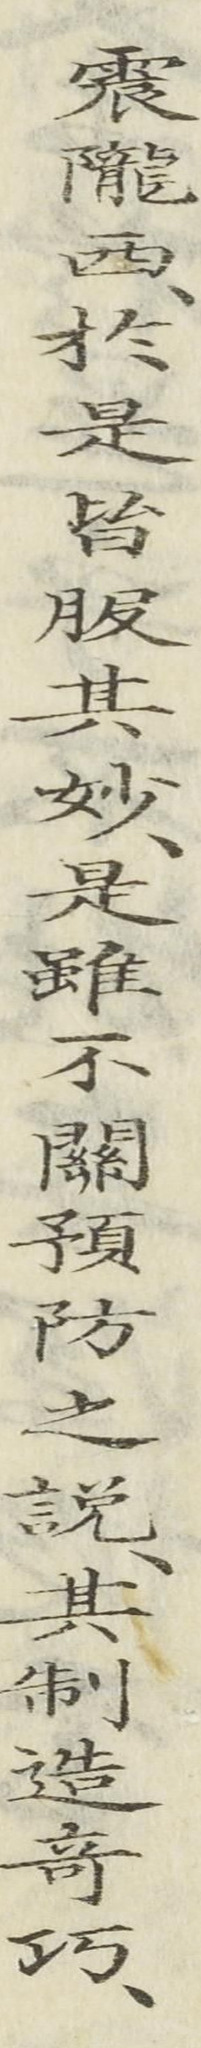震隴西、於是皆服其妙、是雖不関預防之説、其制造奇巧、
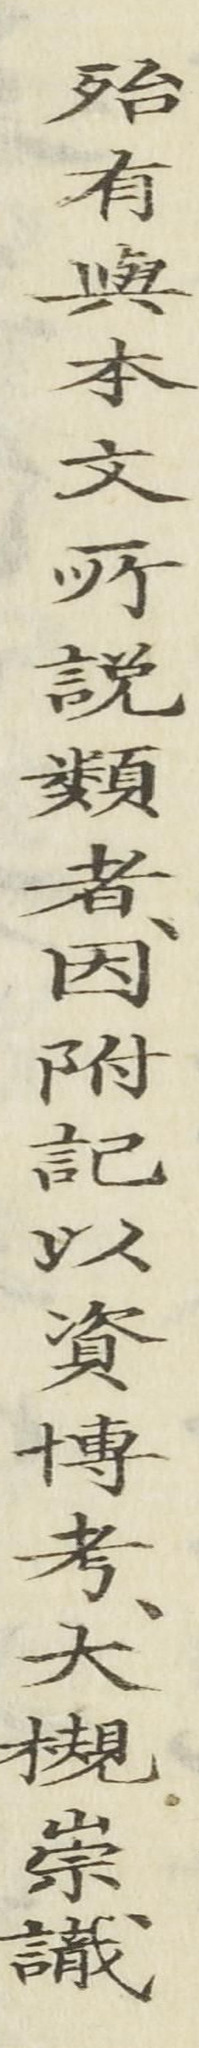殆有與本文所説類者、因附記以資博考、大槻崇識
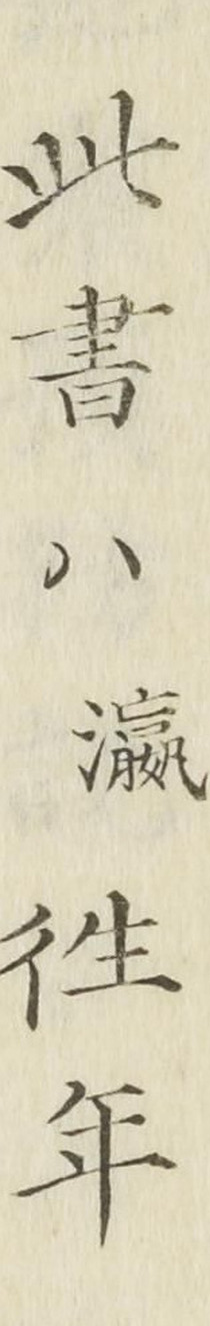此書は瀛徃年
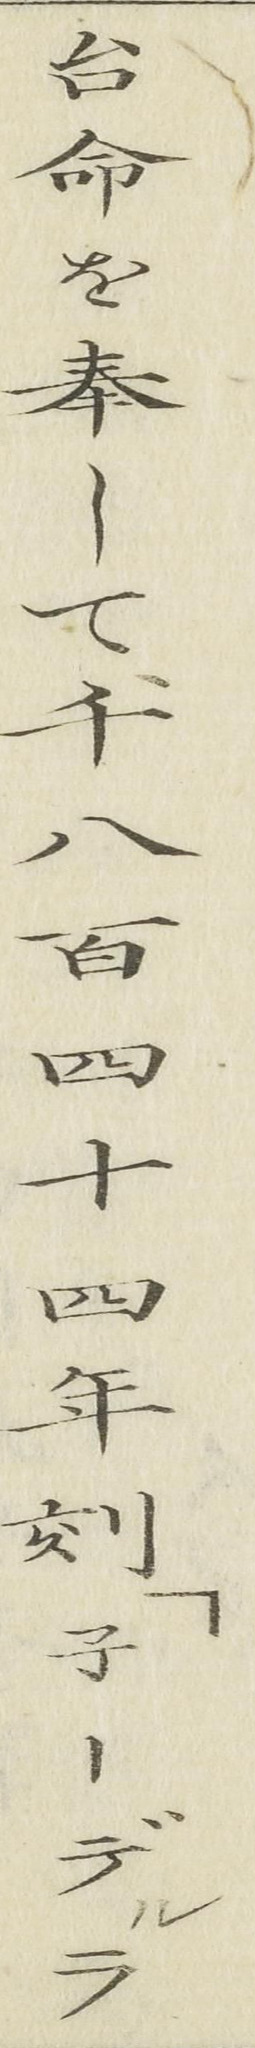台命を奉して、千八百四十四年刻「ネーデ
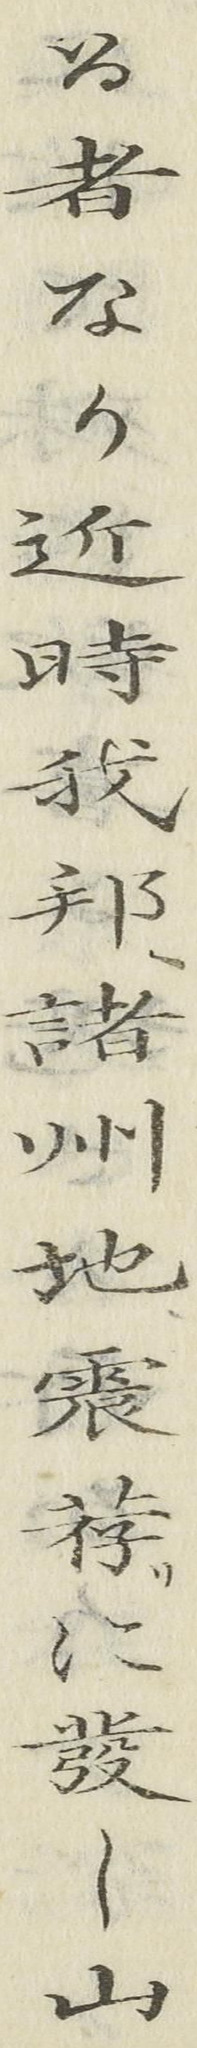る者なり近時我邦、諸州地震荐発し山
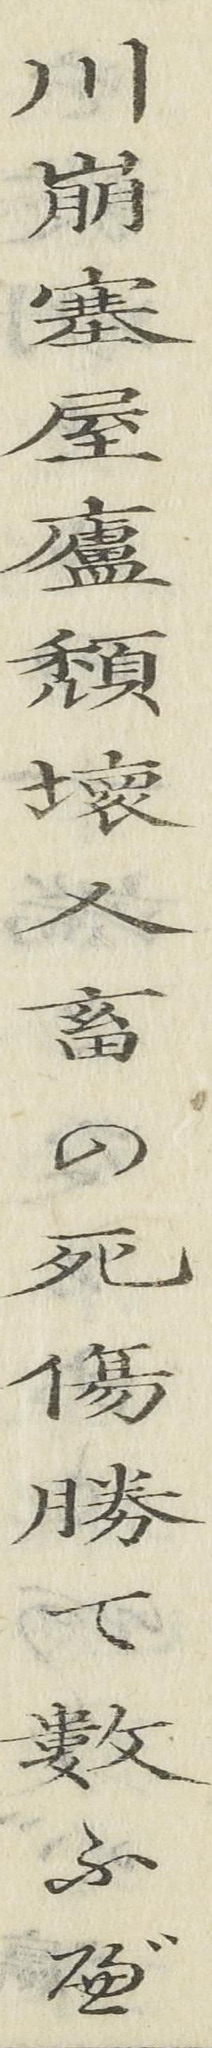川崩塞屋廬頽壊人畜の死傷勝て数ふべ
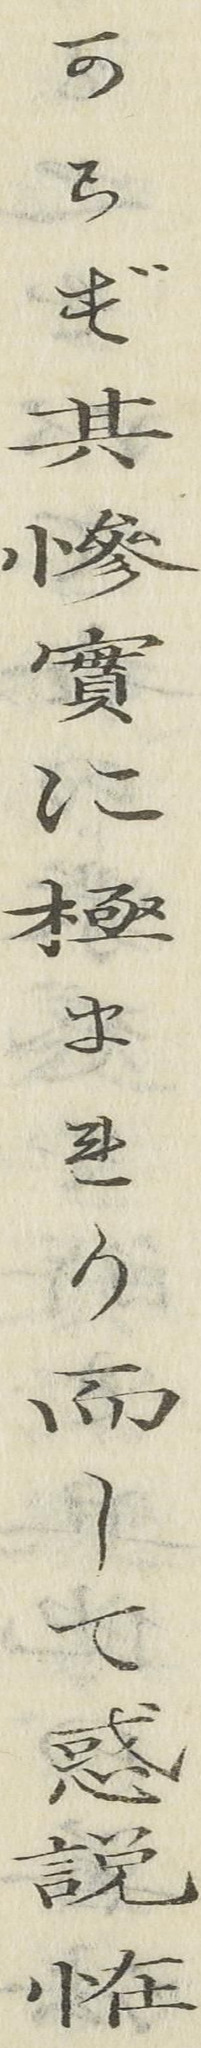からず其惨実に極まれり而して惑説恠
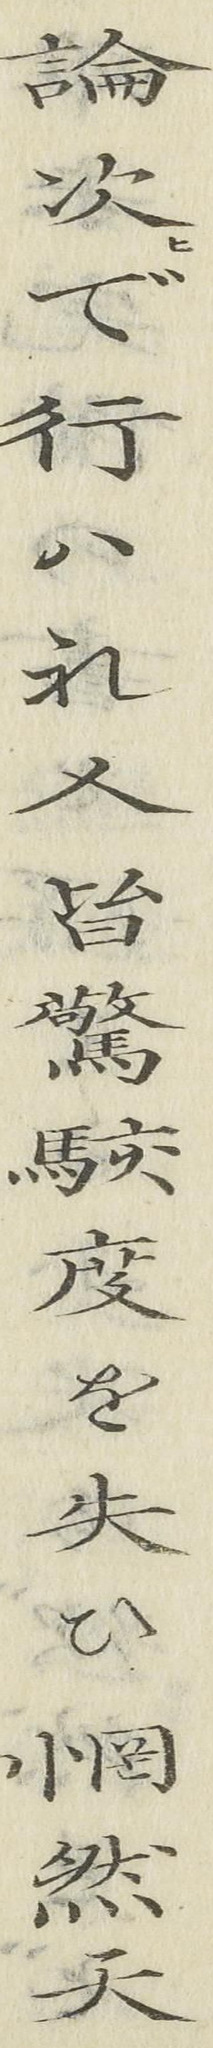論次行はれ人皆驚駭度を失ひ惘然天
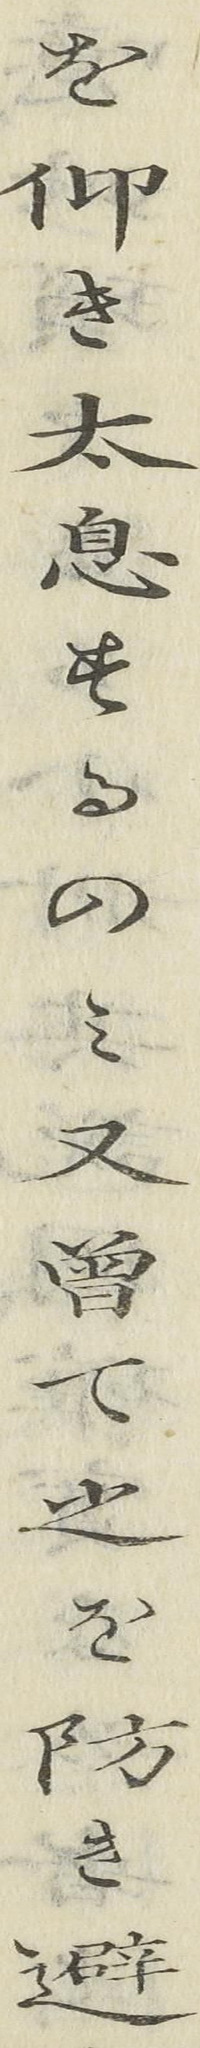を仰き太息するのみ又曽て之を防き避
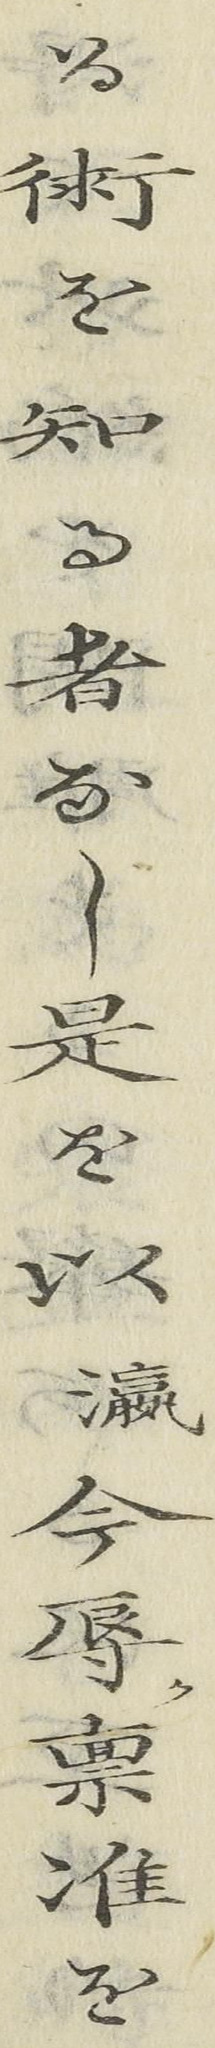る術を知る者なし是を以瀛今辱稟准を

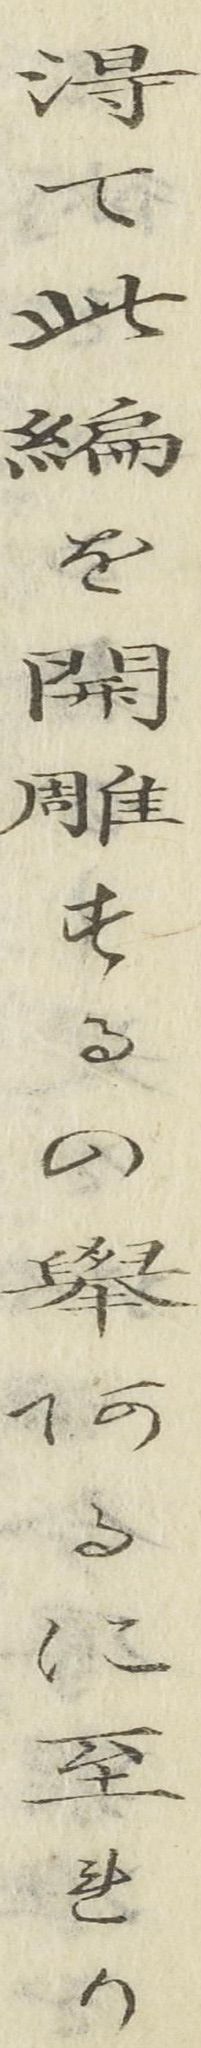淂て此編を開雕するの挙あるに至れり
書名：地震預防説
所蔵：東京大学地震研究所図書室 Earthquake Research Institute Library, The University of Tokyo, JAPAN
